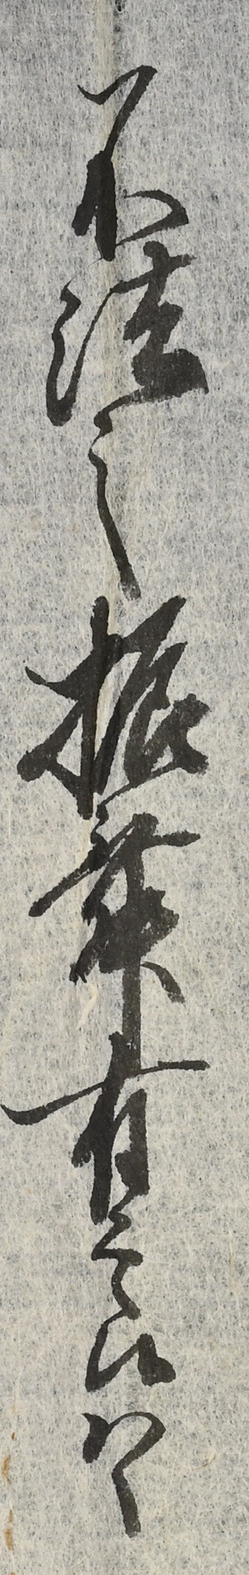不法之振舞有之候ハヽ
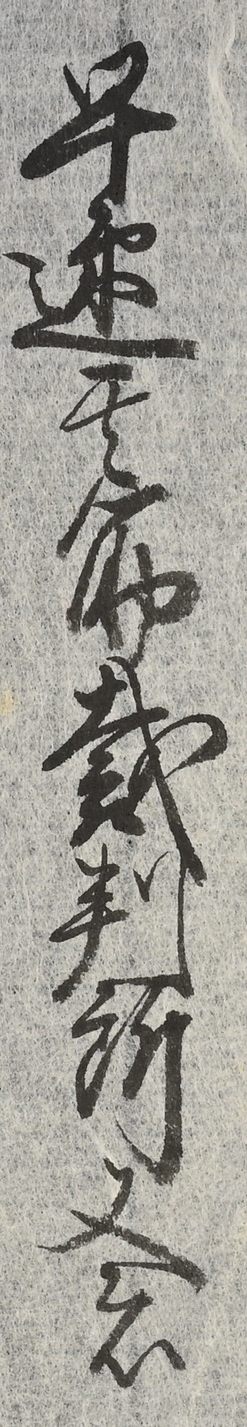早速其筋裁判所又者
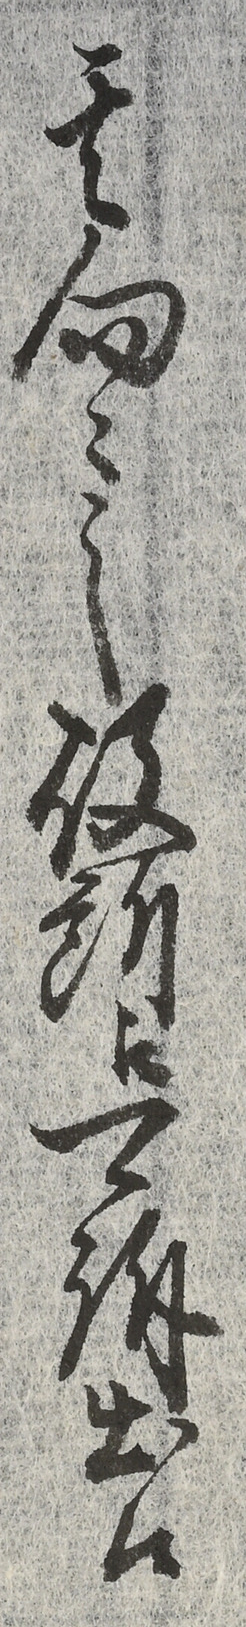ニて向々之役所江可訴出候
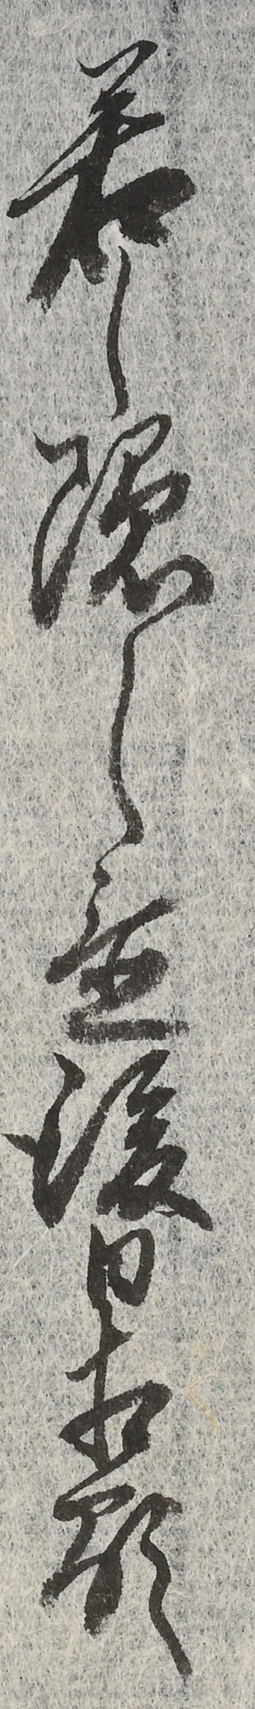若し隠し置後日相顕
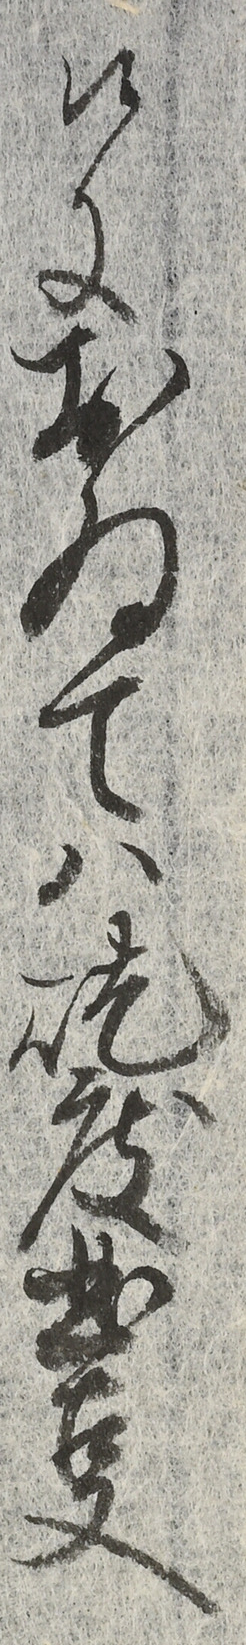候にいゐてハ屹度曲事
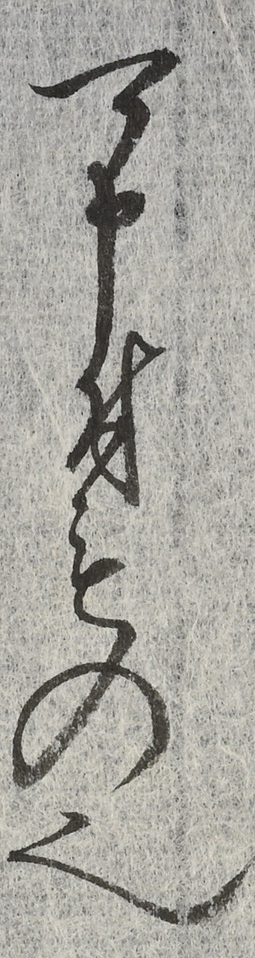可申付もの也
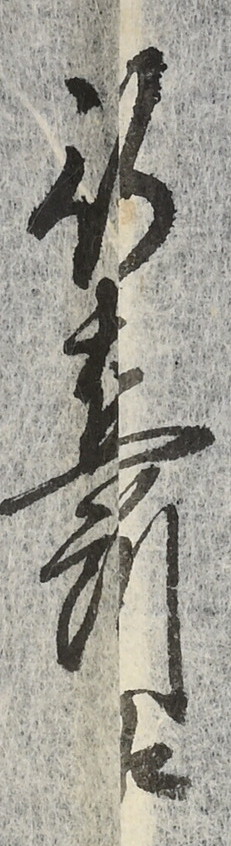行在所江
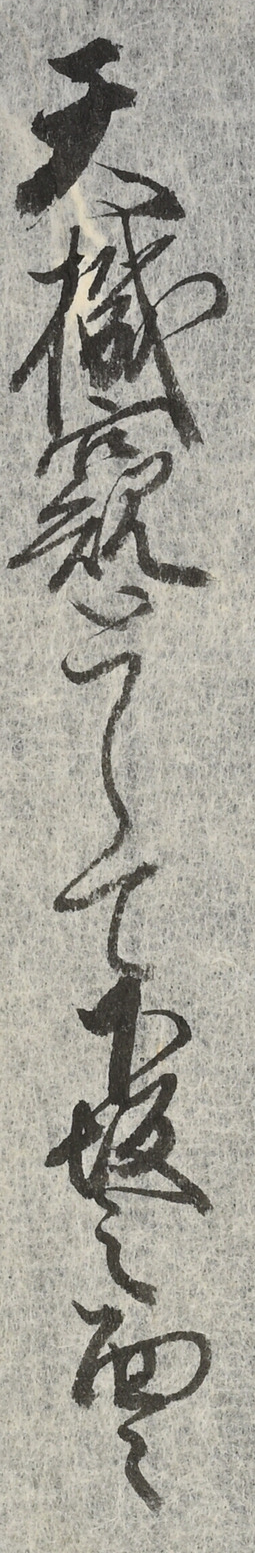天機窺として下坂之面々
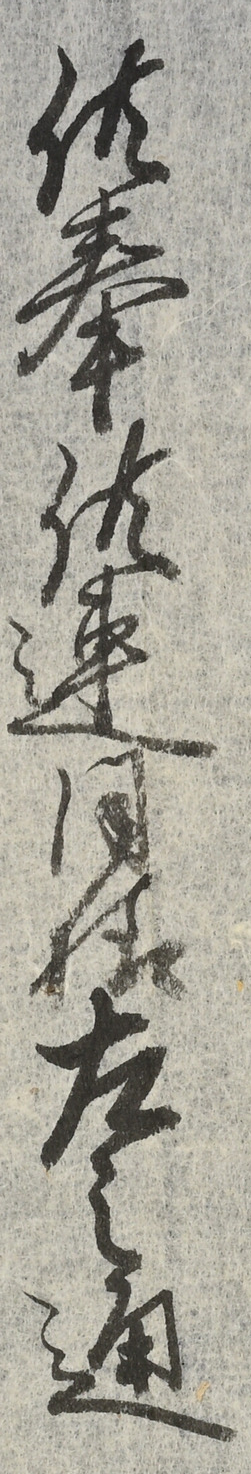供奉供連同様左之通
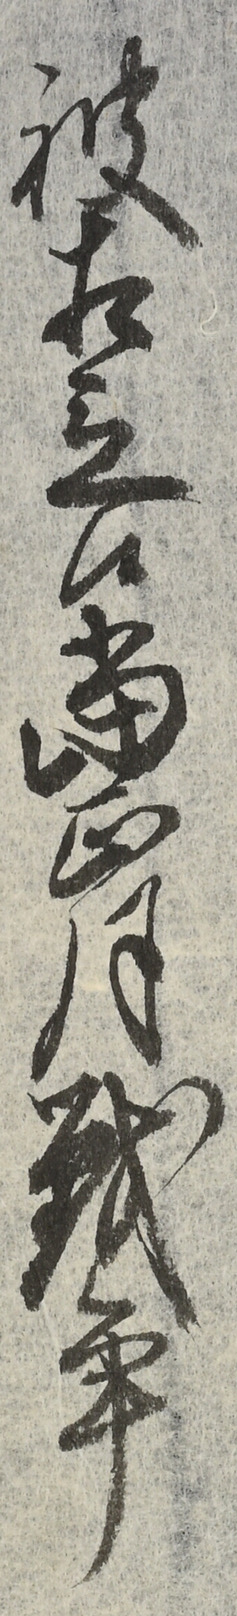被相立候宛正月戦争

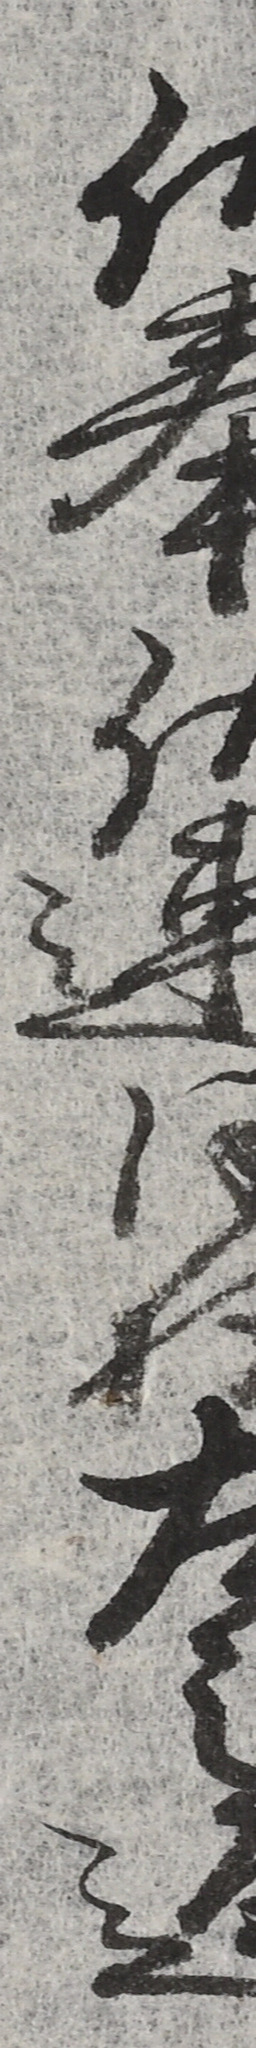供奉供連同様左之通
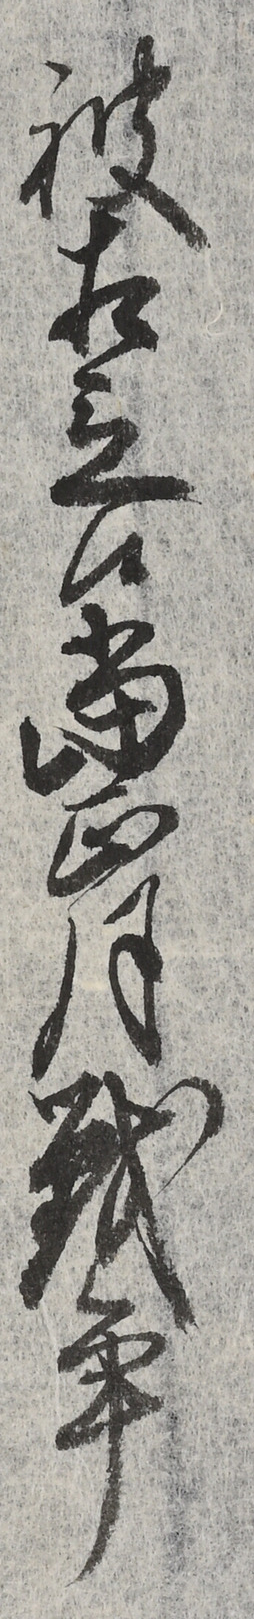被相立候宛正月戦争
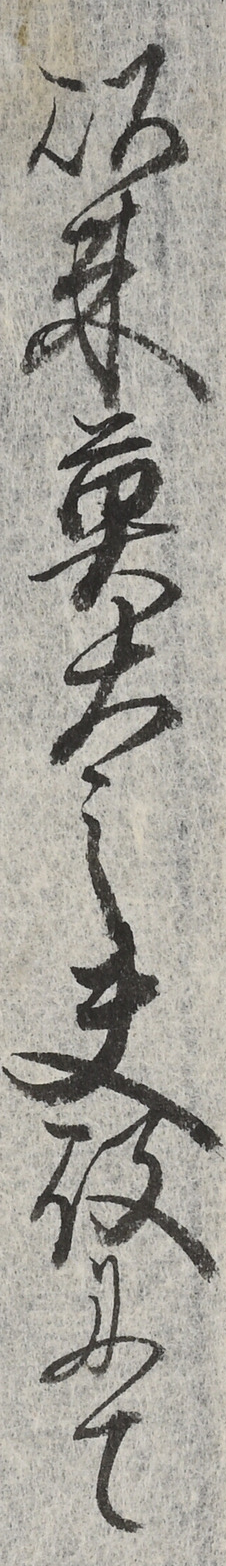以来莫大之夫役にて
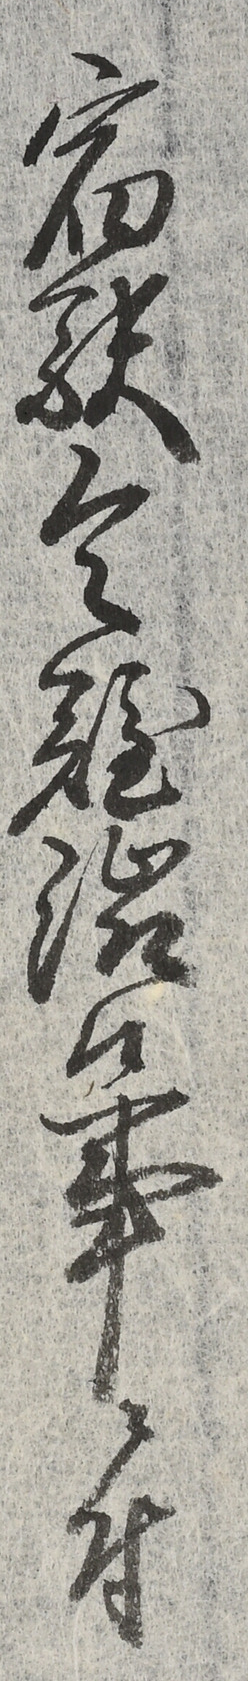宿駅令難渋候事ニ付
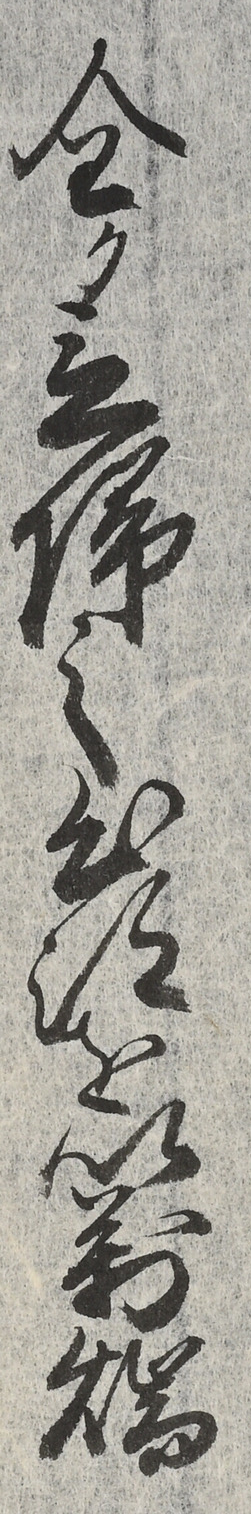全ク立帰之心得を以万端
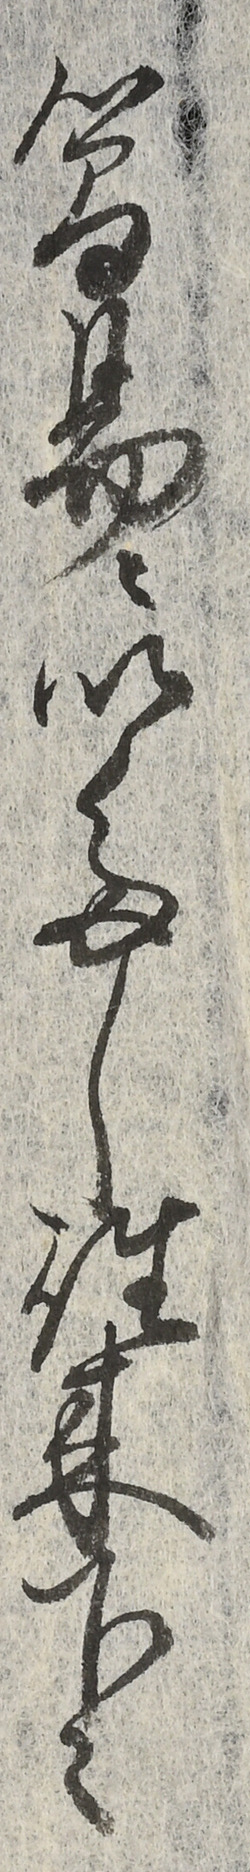簡易ニいたし往来下々
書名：布告（写）
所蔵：伊那市立高遠町図書館・合同会社AMANE
